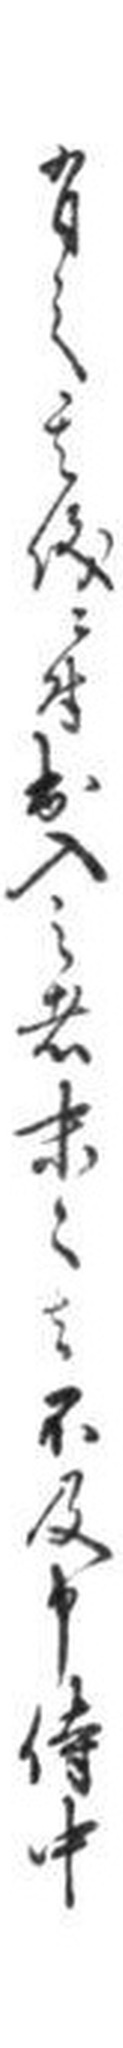有之其儀ニ付出入之者末々者不及申侍中
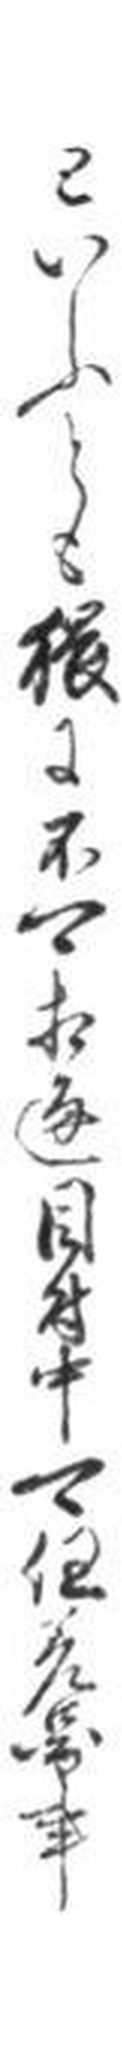といふとも猥に不可相通目付中可任差図事
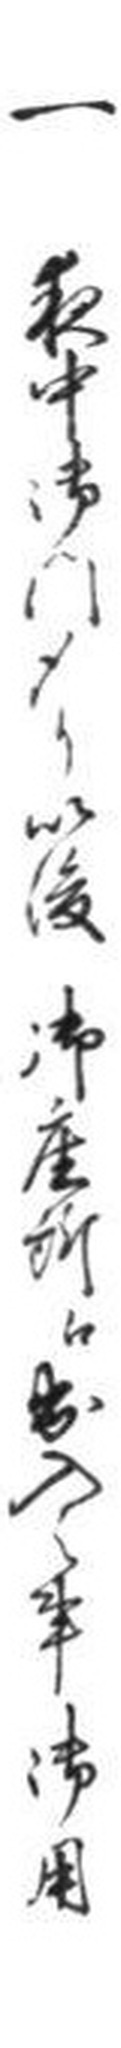一夜中御門〆り以後御座所江出入之事御用
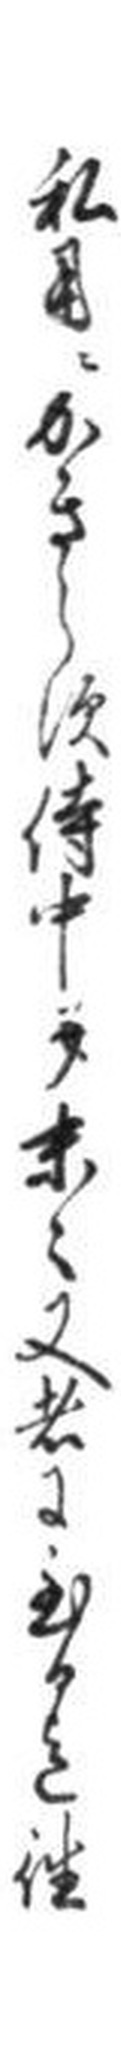私用ニかきらす侍中并末々又者に至る迄往
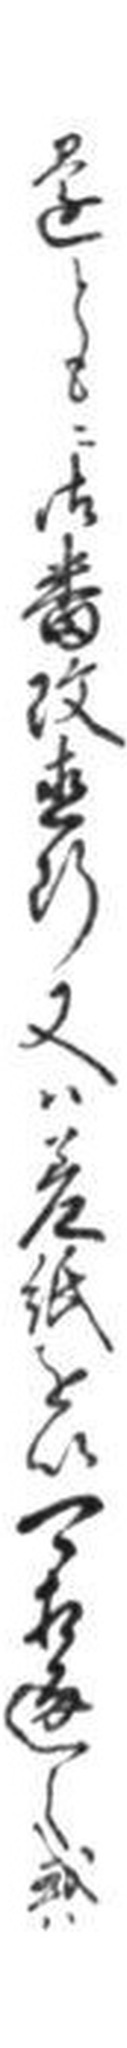還ともニ御番改直断又ハ差紙を以可相通之或ハ
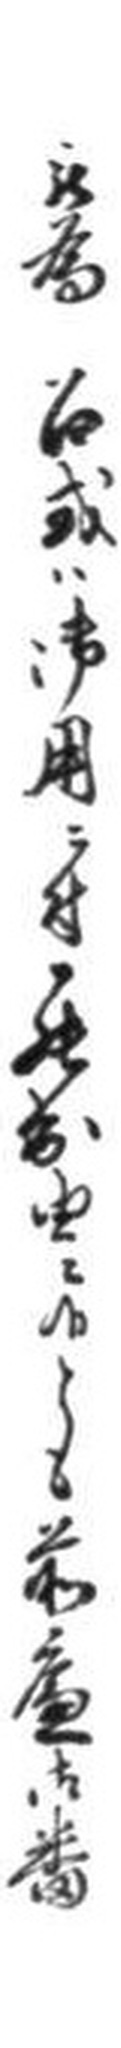被為召或ハ御用ニ付罷出由ニ候とも前広御番
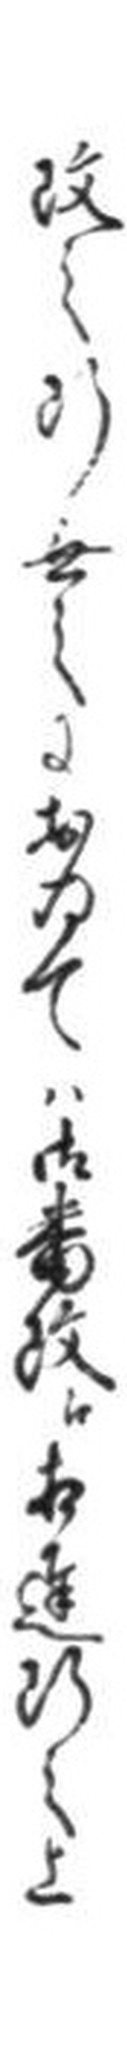改之断無之におゐてハ御番改江相達断之上
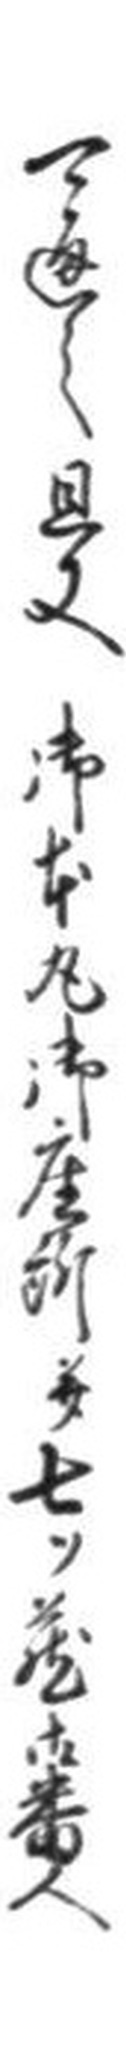可通之且又御本丸御座所并七ツ蔵御番人
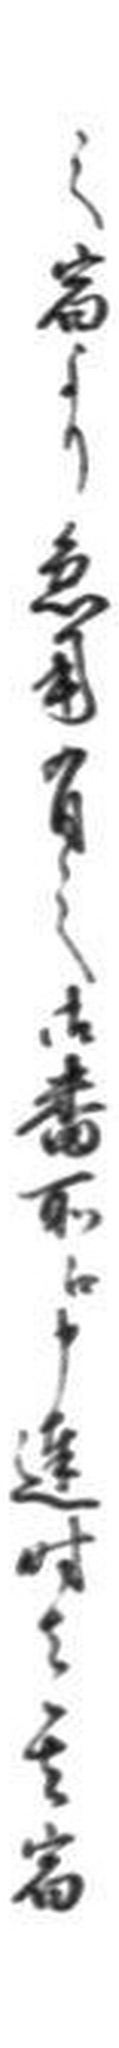之宿より急用有之御番所江申達時者其宿
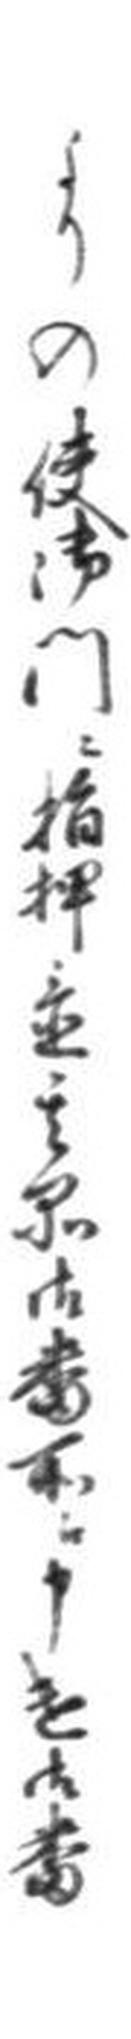よりの使御門ニ指押置其品御番所江申遣御番
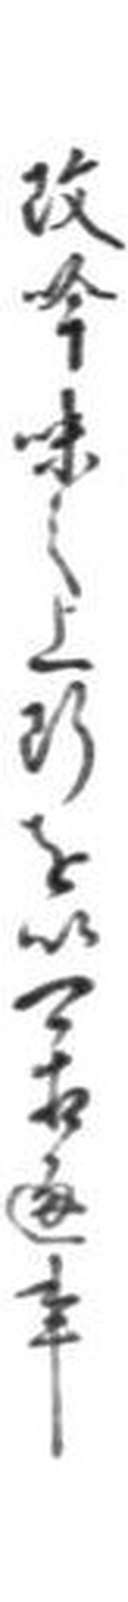改吟味之上断を以可相通事
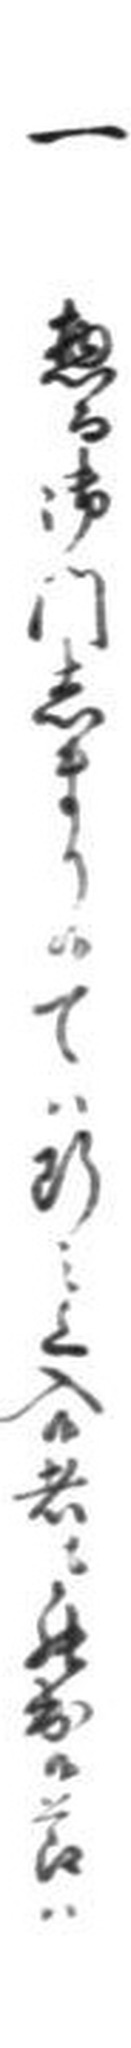一惣而御門しまり候てハ断之上入候者も罷出候節ハ
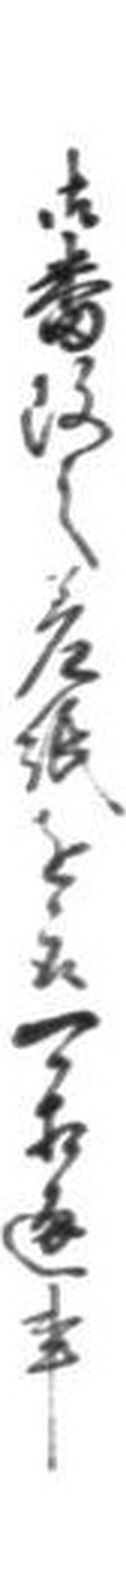御番改之差紙を取可相通事
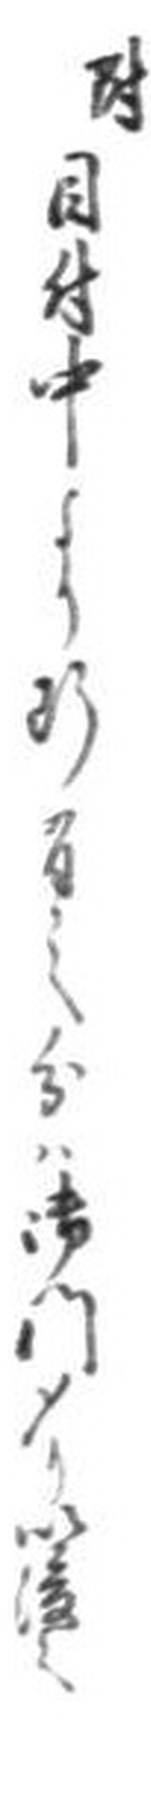目付中より断有之分ハ御門〆り以後之
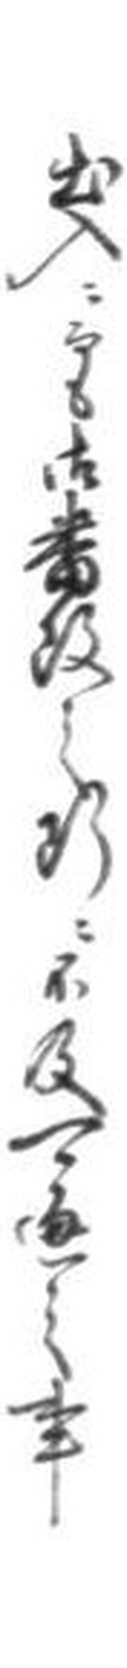出入ニ而も御番改之断ニ不及可通之事
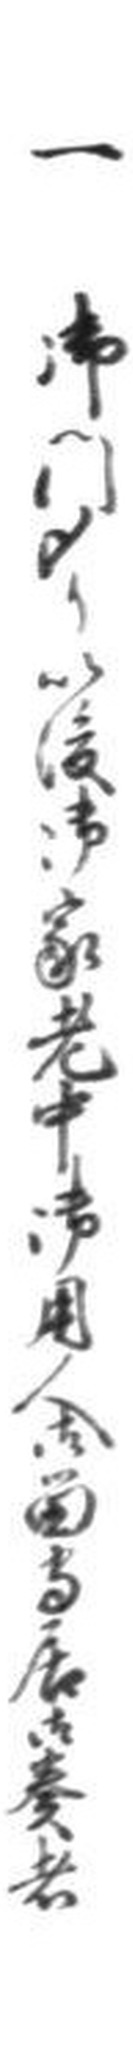一御門〆り以後御家老中御用人御留守居御奏者
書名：家譜 三十三 吉邦公 享保四年
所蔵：福井県文書館 Fukui Prefectural Archives
